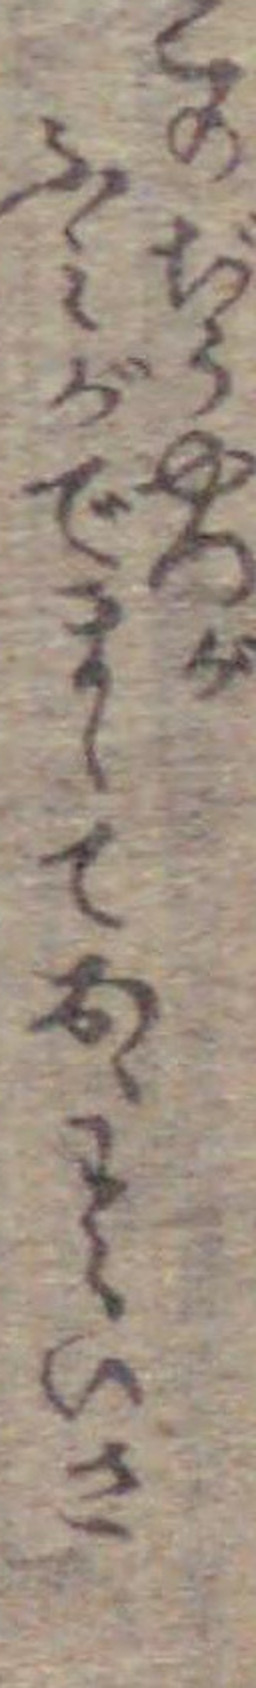ふみがでまして大わらいさ
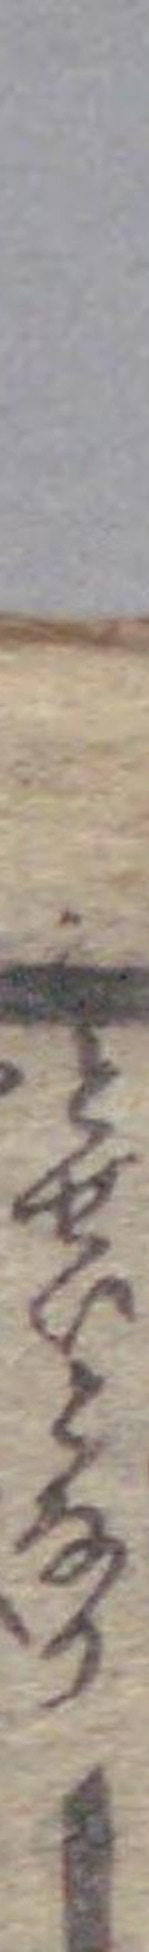とせいとなり
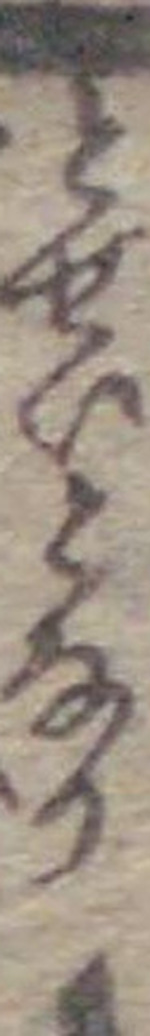とせいとなり
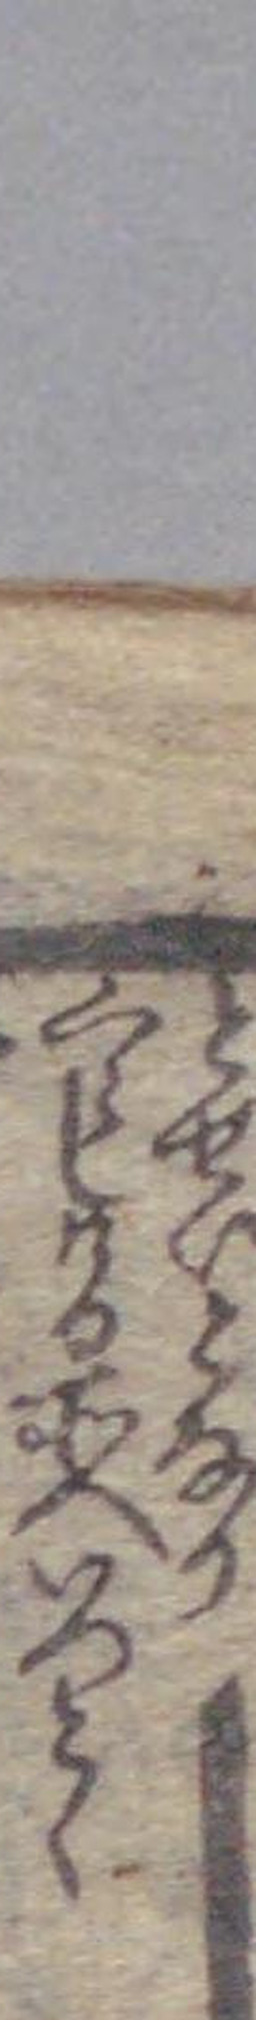くらしける所へいつとこ
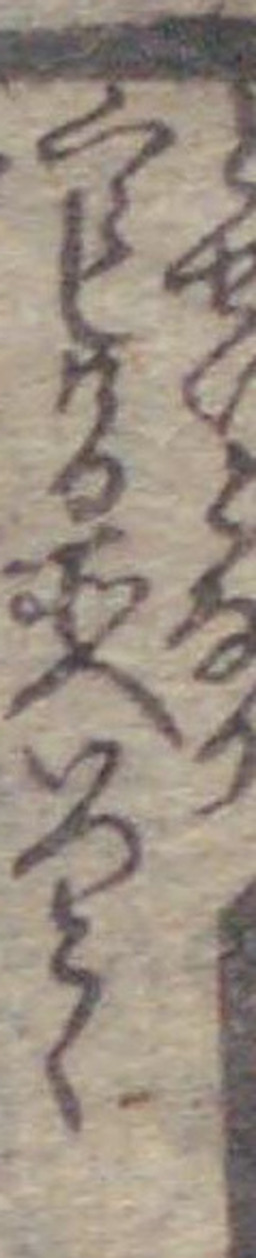くらしける所へいつとこ
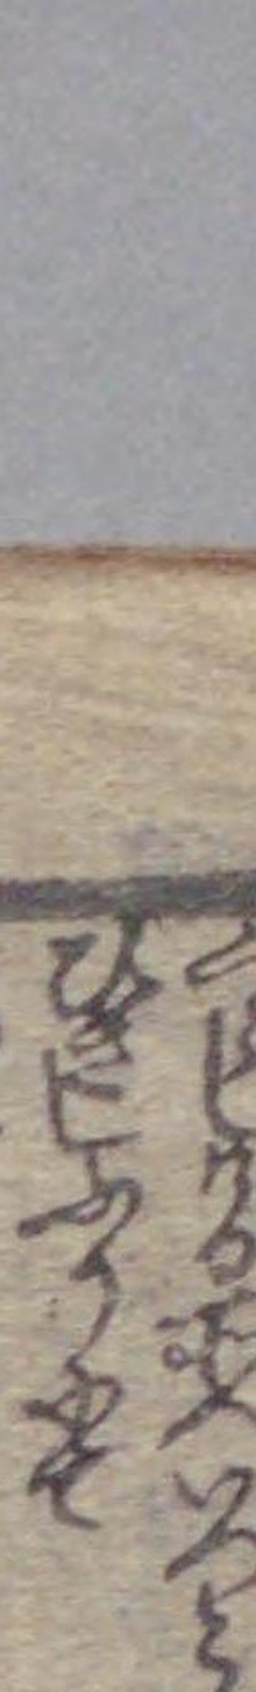ひさしふりにて
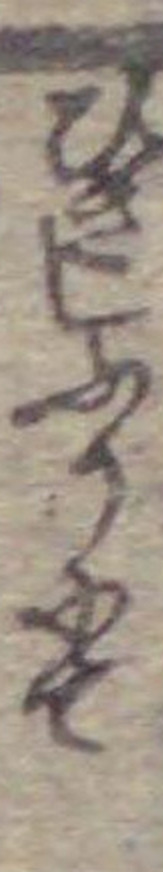ひさしふりにて
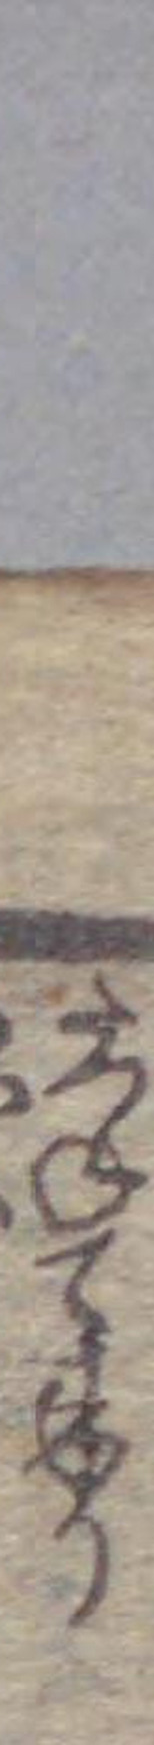たつねて来り
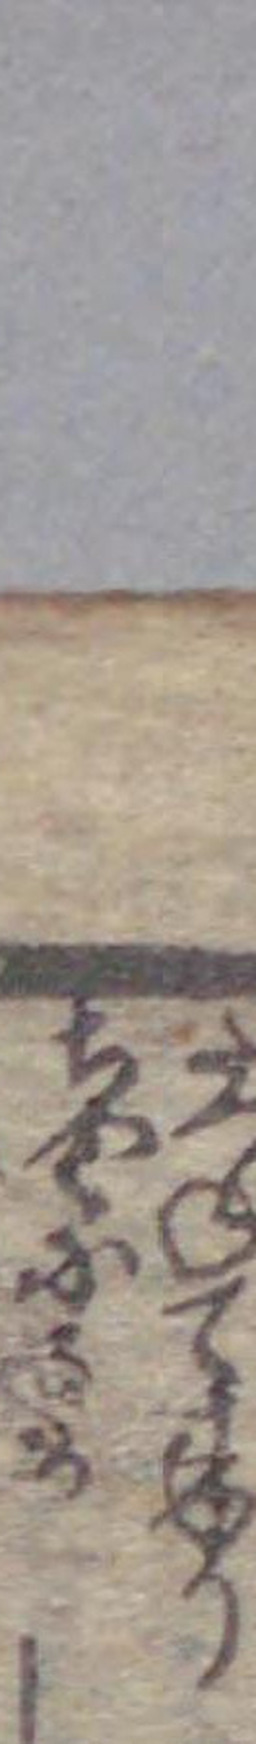ちやにうか
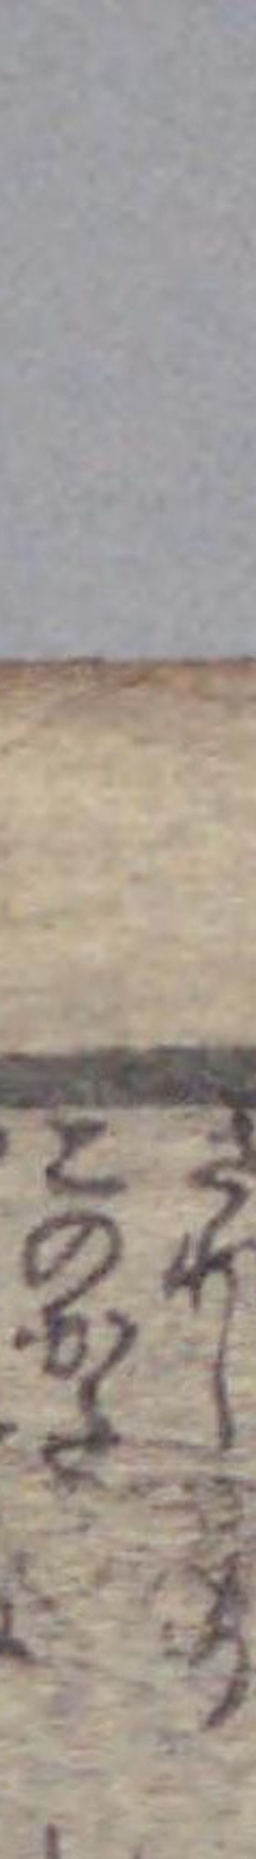このかた
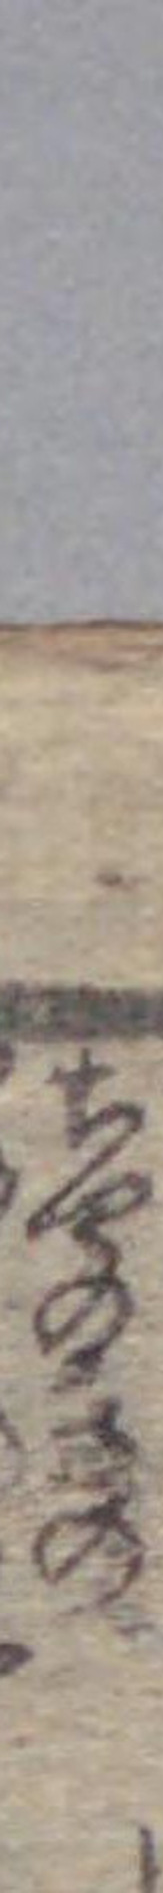ちやのきの
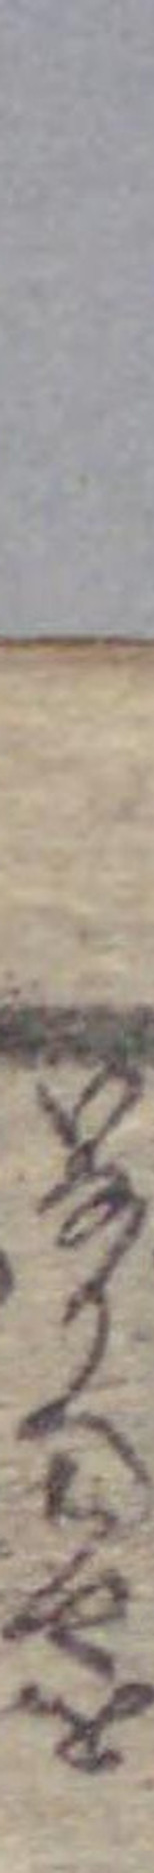いなりへちやを
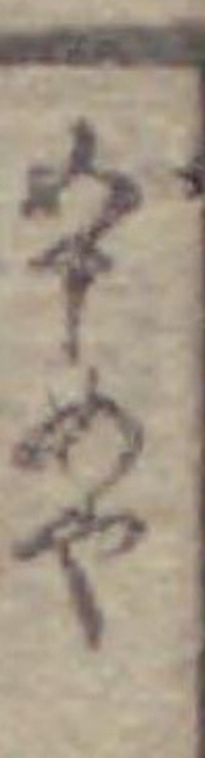五十めや
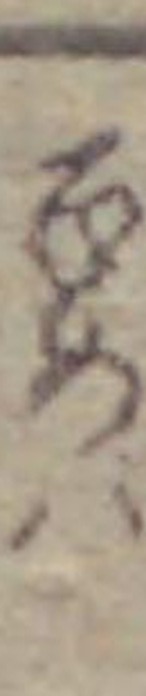百めは
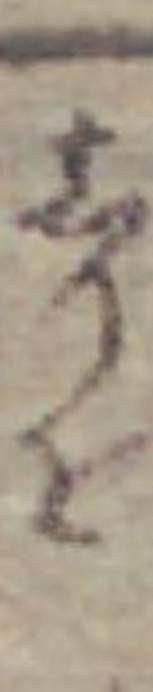しりを
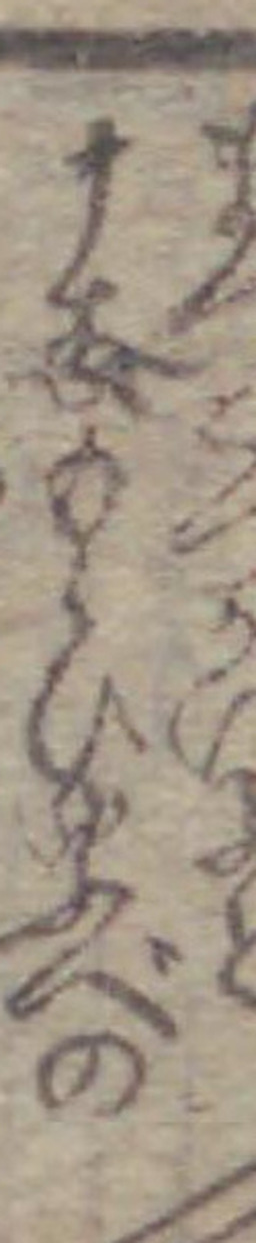十両もらひゆふべの
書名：見通占 : 3巻
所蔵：国立国会図書館 National Diet Library, JAPAN
